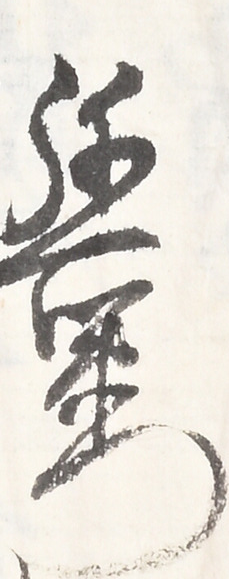弥右衛門
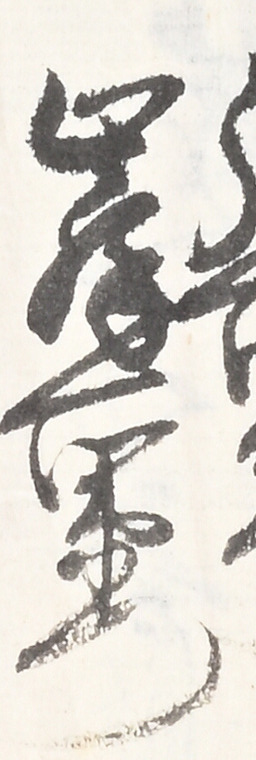弥右衛門
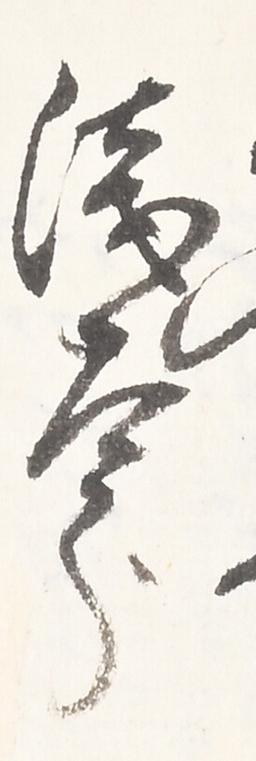浅太郎
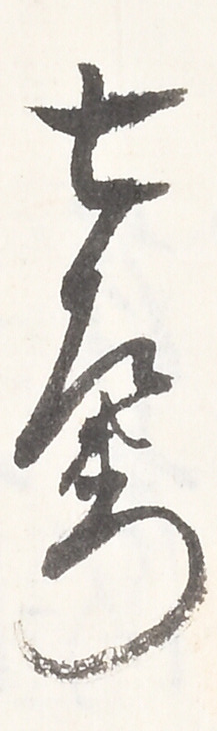七左衛門
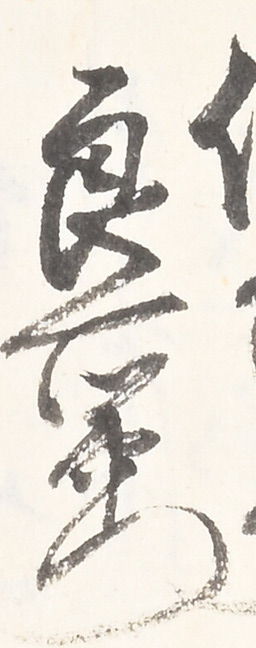良右衛門
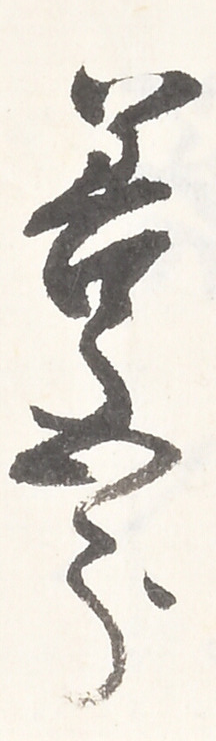善五郎
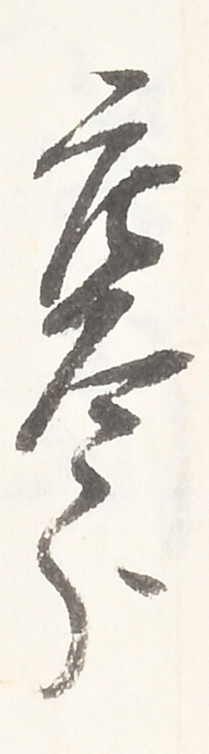庄太郎
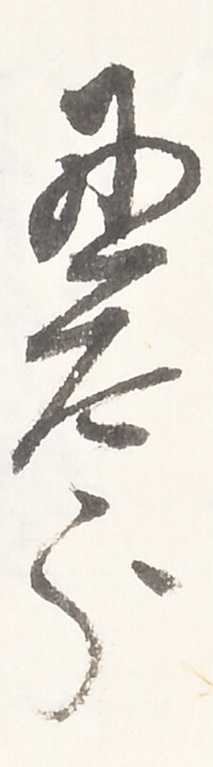丑太郎
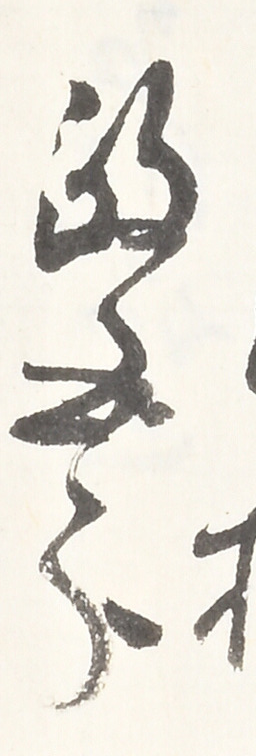政五郎
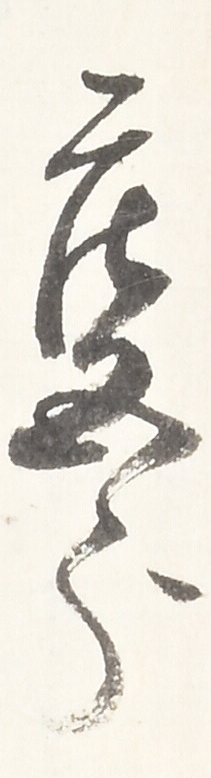庄五郎
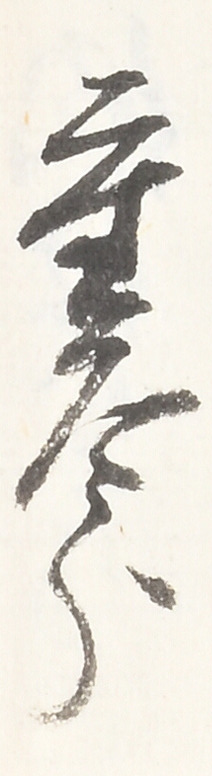重太郎
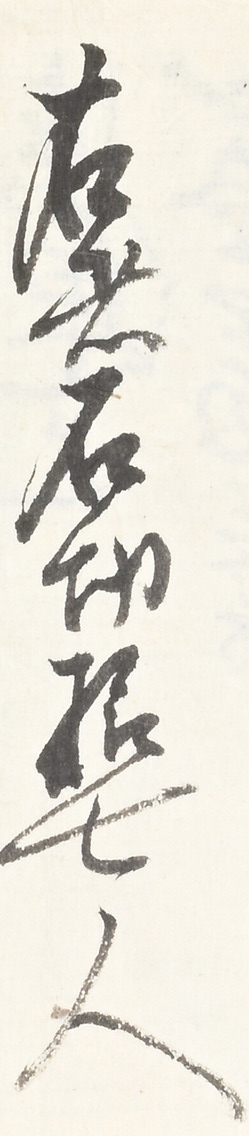右者石切拾七人

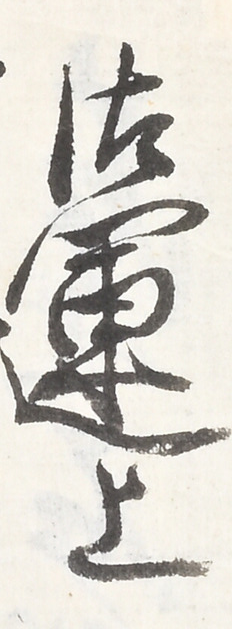御運上
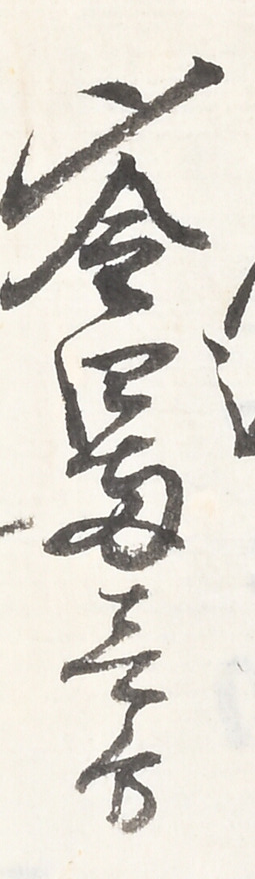〆金四両壱分
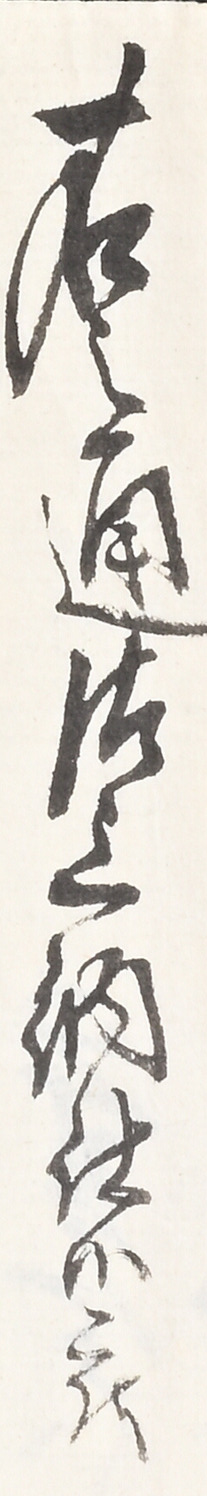右之通御上納仕候被
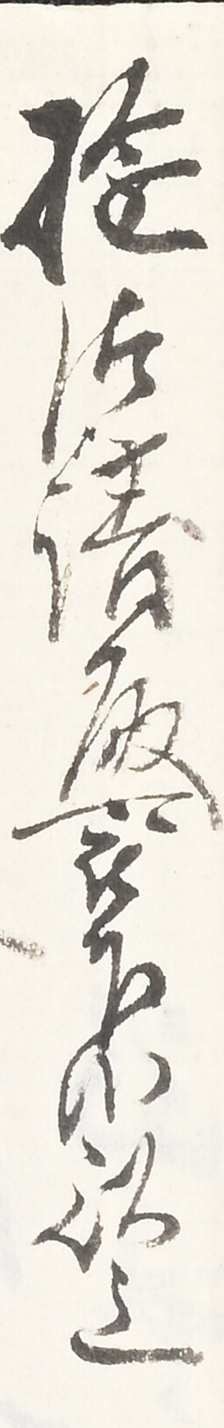遊御請取可被下候以上
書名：覺
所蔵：伊那市立高遠町図書館・合同会社AMANE
